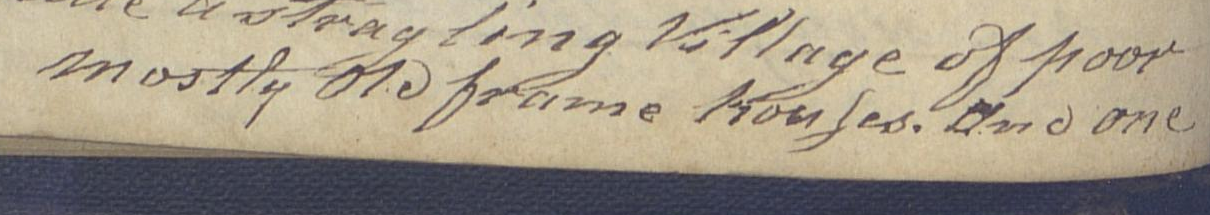mostly Old frame houses. And one
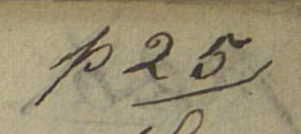p25
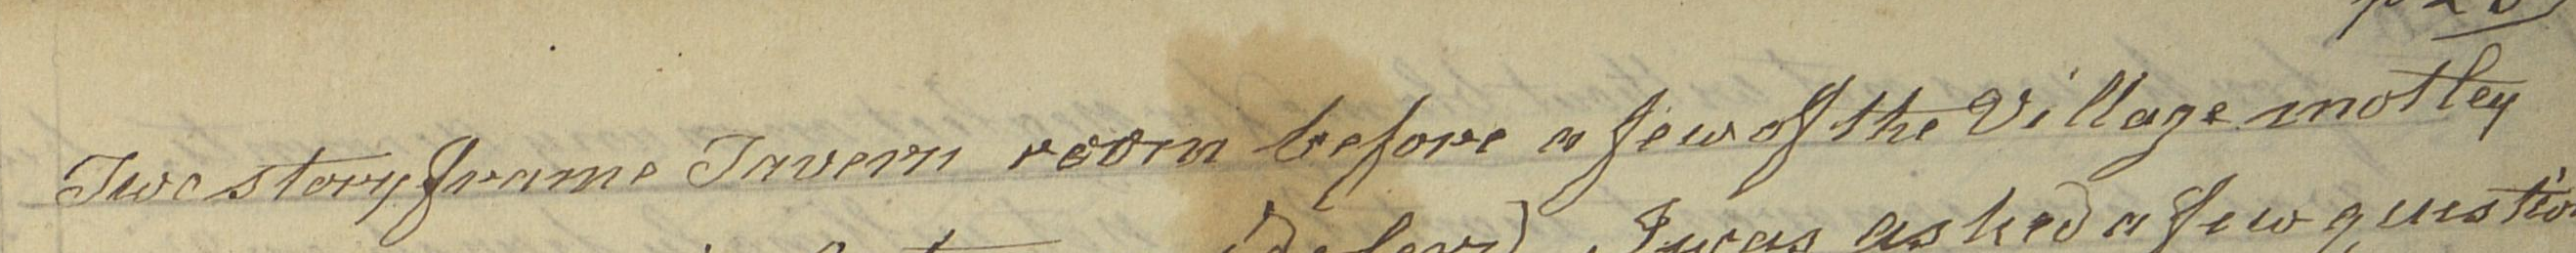Two story frame Tavern roorn before a few of the Village mostley
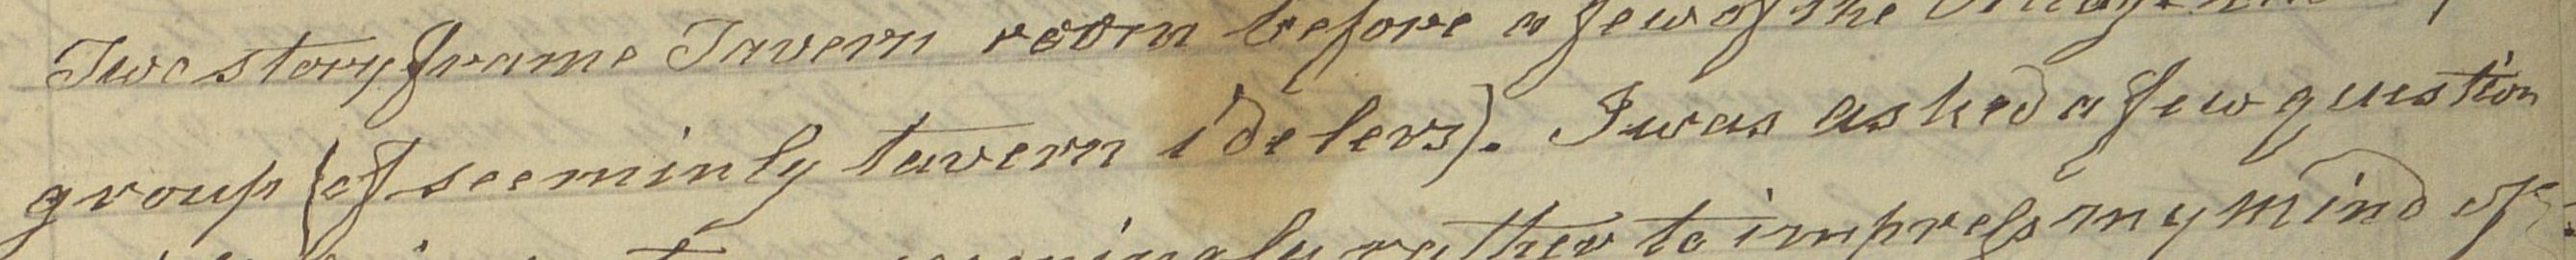group (of seemingly tavern delers). I was asked a few question
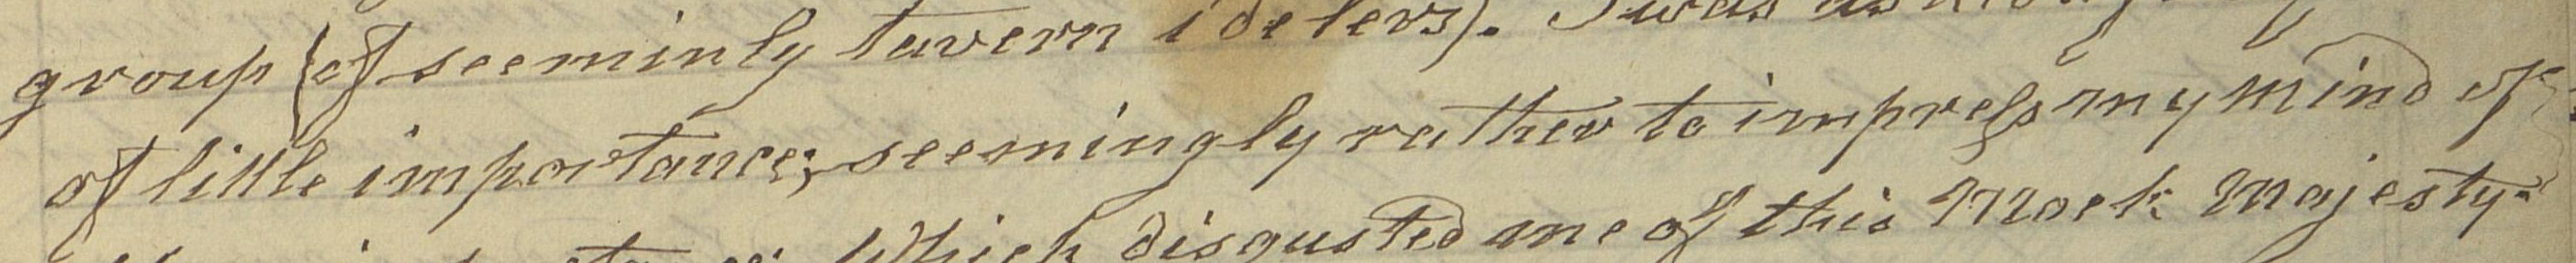of little importance; seemingly rather to impress my mind of
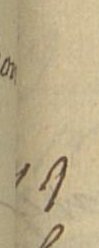9
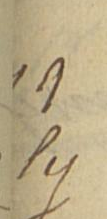-ly
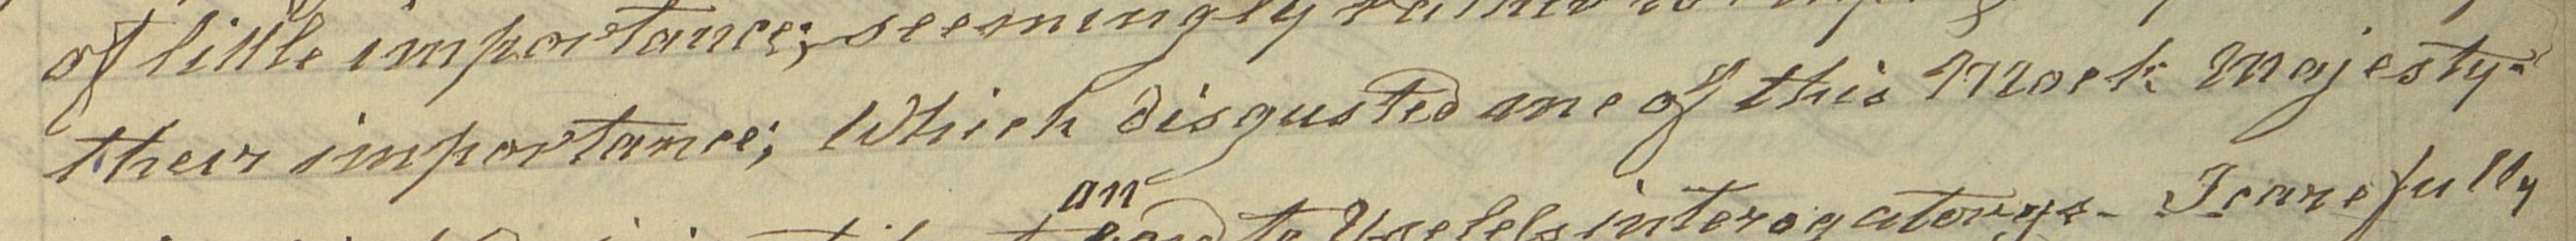their importance; which disgusted one of this much Majesty.
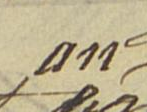an
